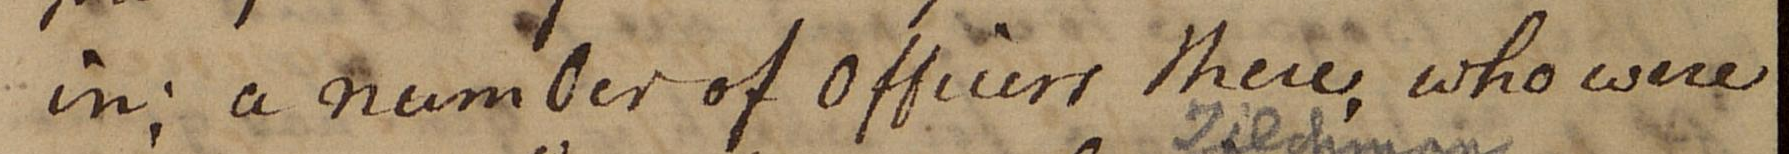in; a number of Officers there who were
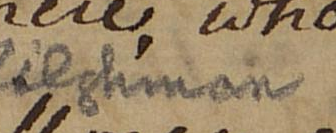Tilghman
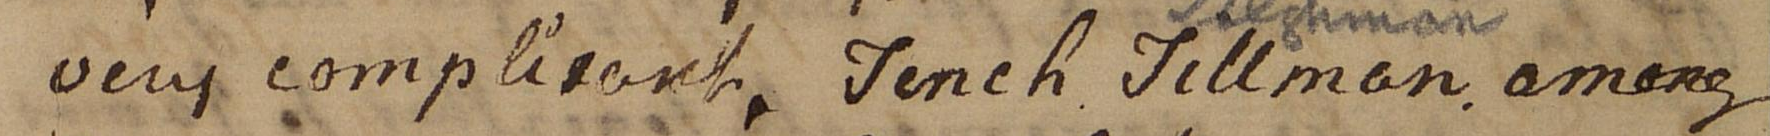very complisant, Tench Tillman among
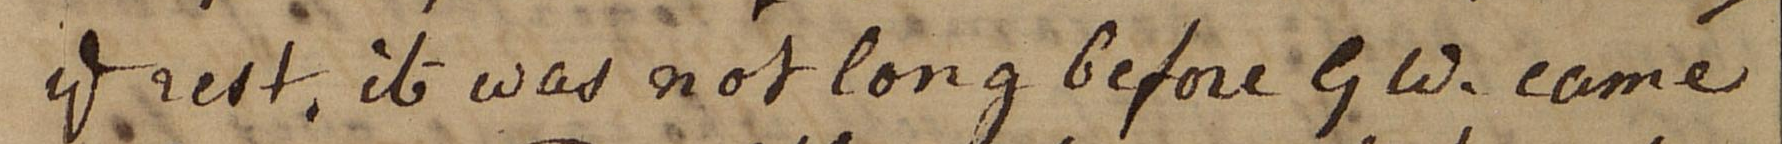y^e rest, it was not long before GW. came
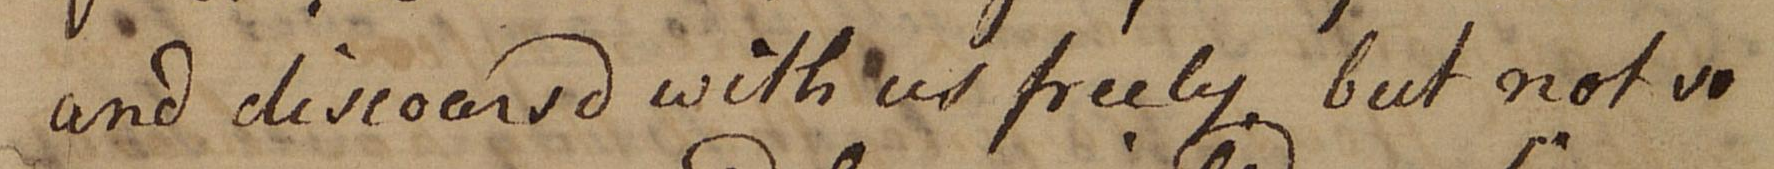and discoarsd with us freely but not so
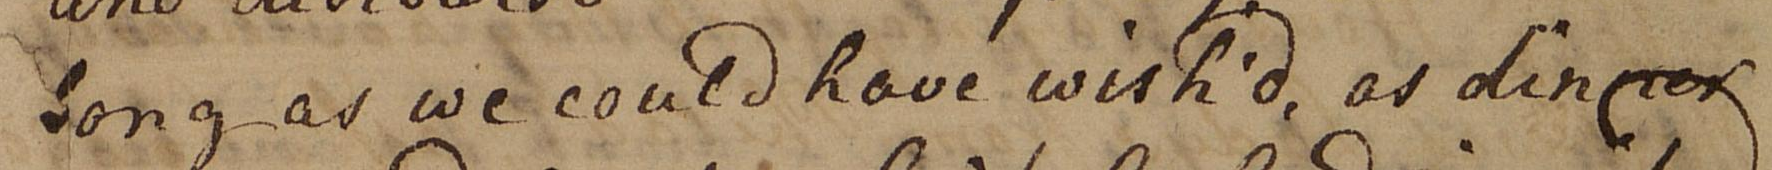long as we could have wish'd, as dinner
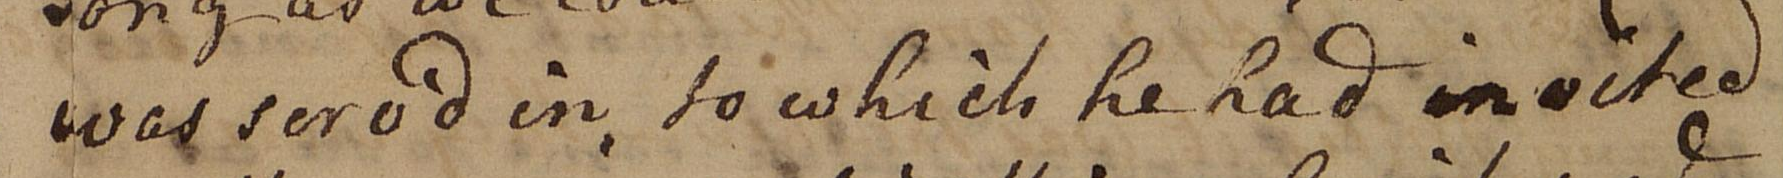was serv'd in, to which he had invited
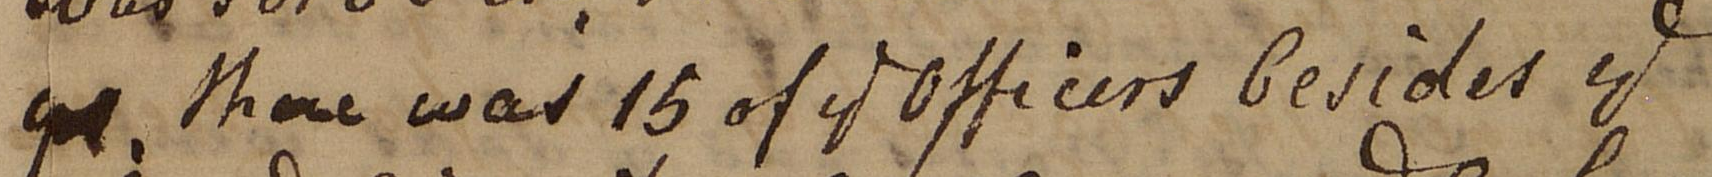[__], there was 15 of y^e Officers besides y^e
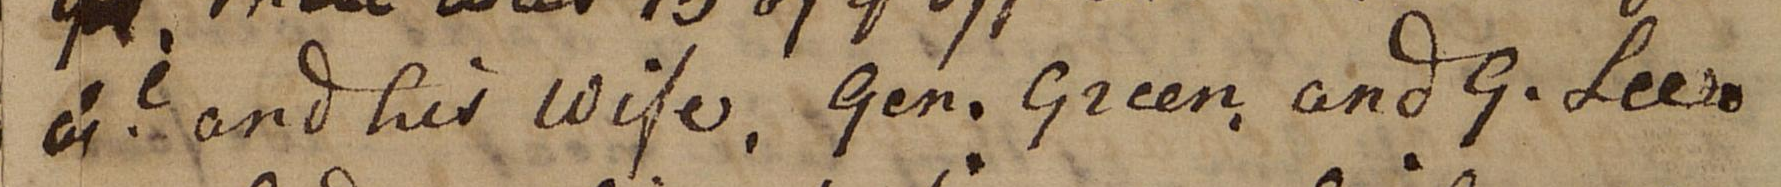G^l. and his wife. Gen. Green and G. Lees
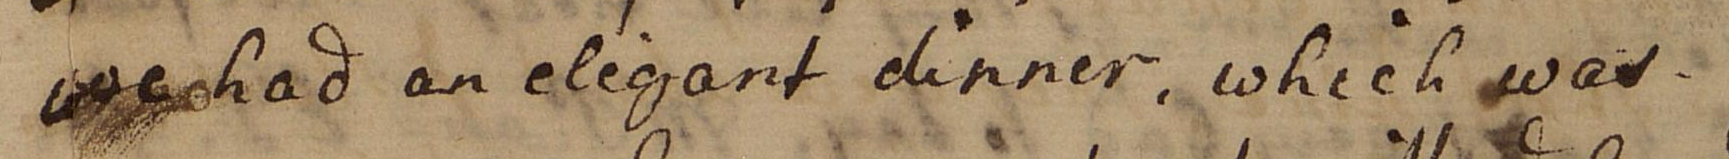we had an elegant dinner. which was
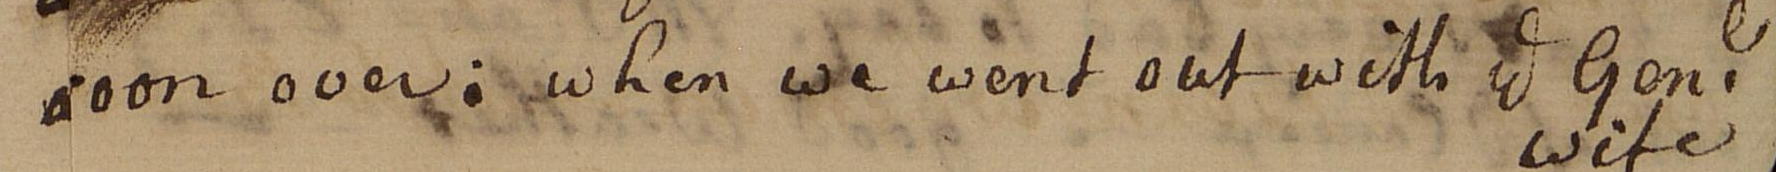soon over: when we went out with y^e Gen.^l
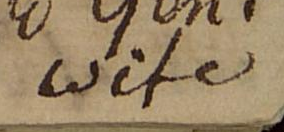wife
